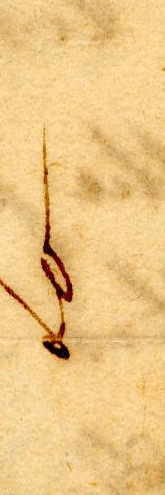To
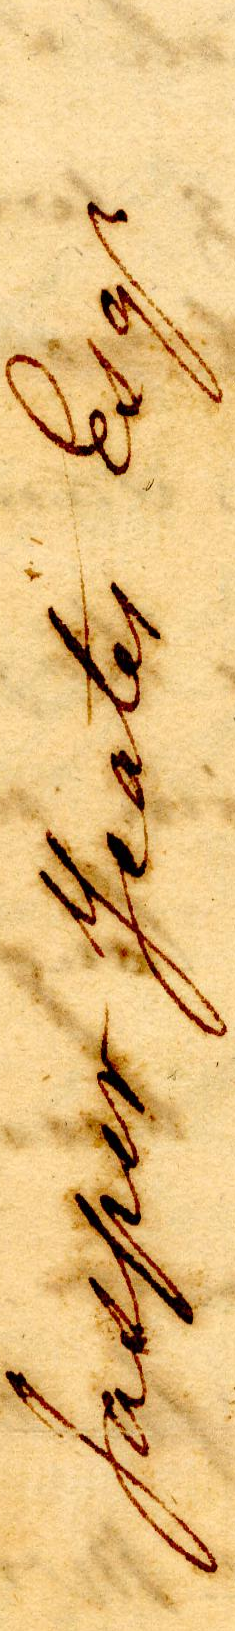Jasper Yeates Esq^r
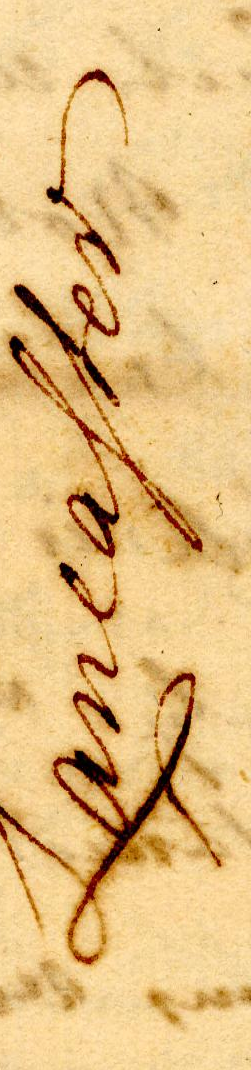Lancaster
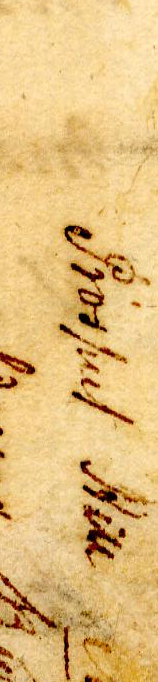Prospect Hill
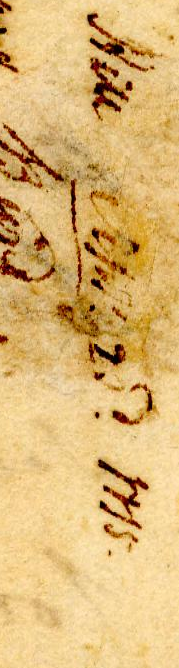Sept^r 22^d. 1775.
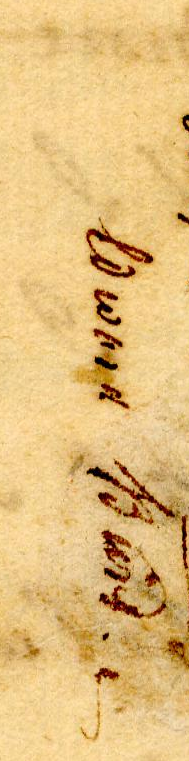Edward Burd
